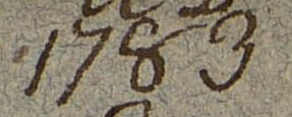1783
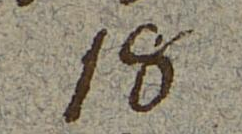18
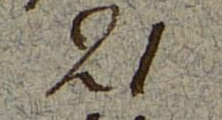21
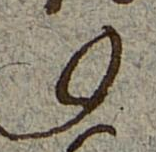9
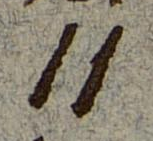11
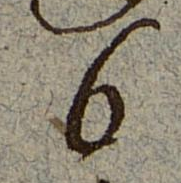6
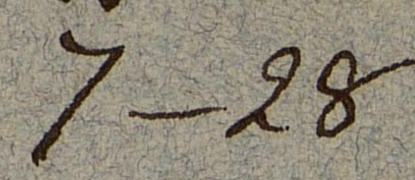7-28
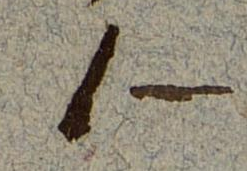1-
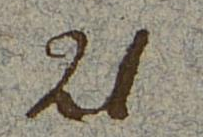21
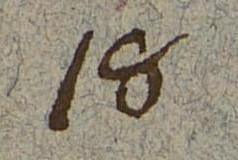18
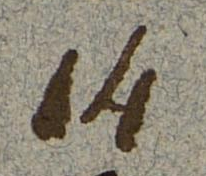14
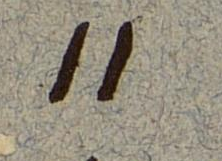11
